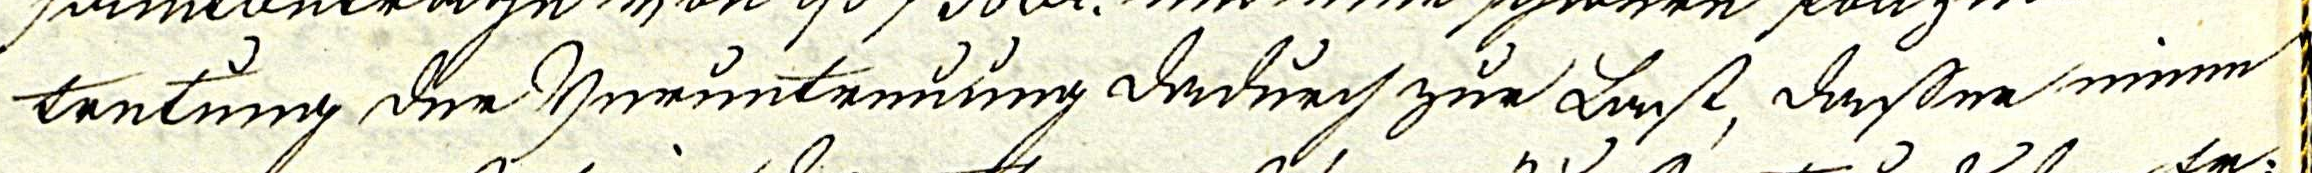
tretung der Veruntreuung dadurch zur Last, daß er einen
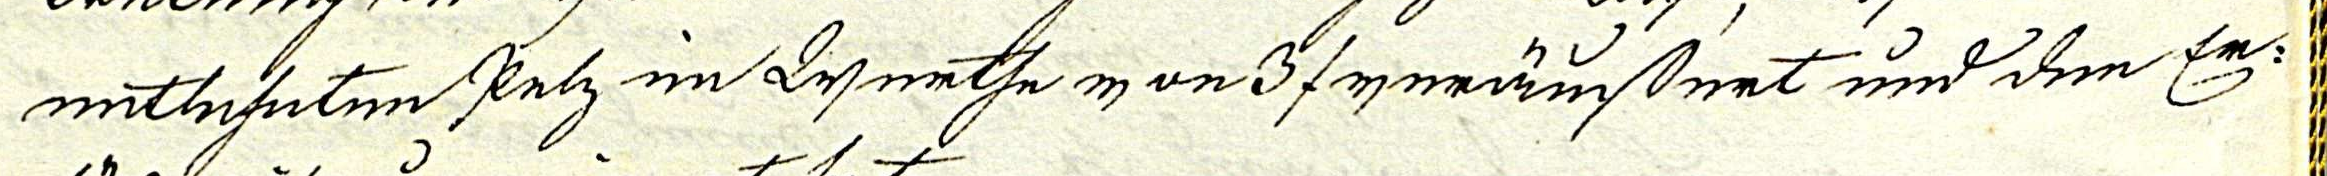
entlohnten Pelz im Werthe von 3f veräußert und den Er¬
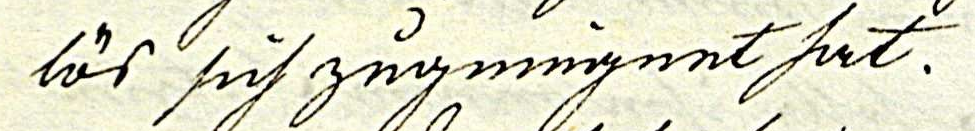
lös sich zugeeignet hat.
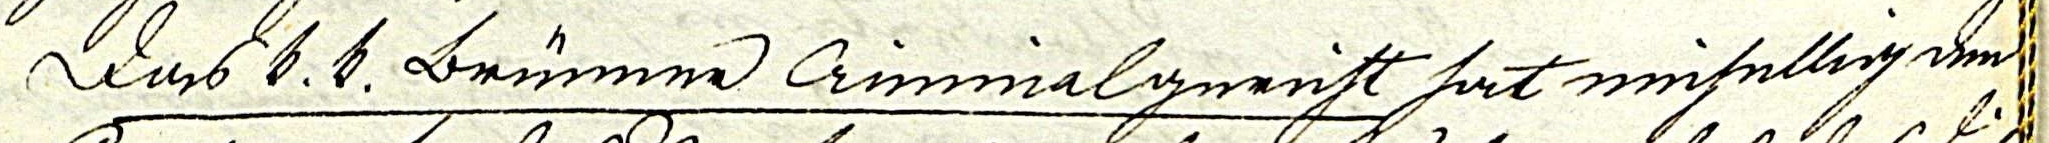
Das k.k. Brünner Criminalgericht hat einhellig den
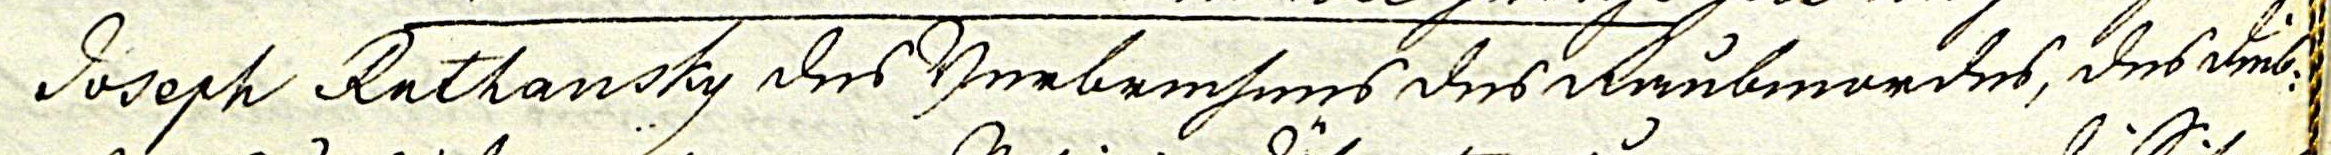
Joseph Rathansky des Verbrechens des Raubmordes, des Dieb¬
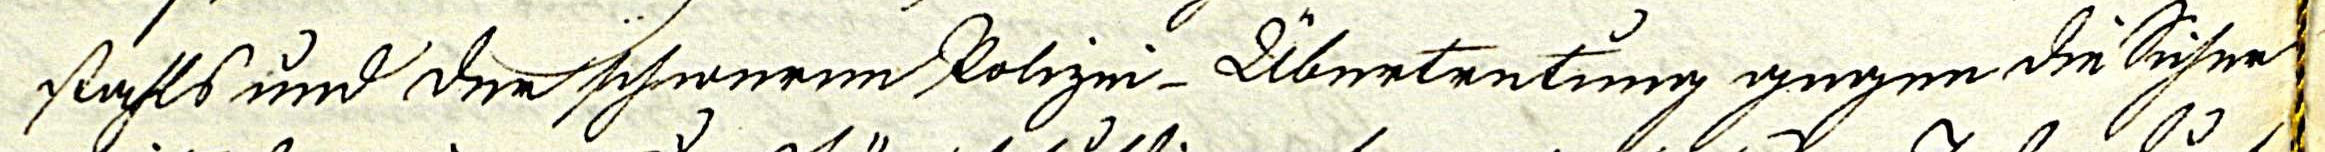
stahls und der schweren Polizei-Übertretug gegen die Sicher¬
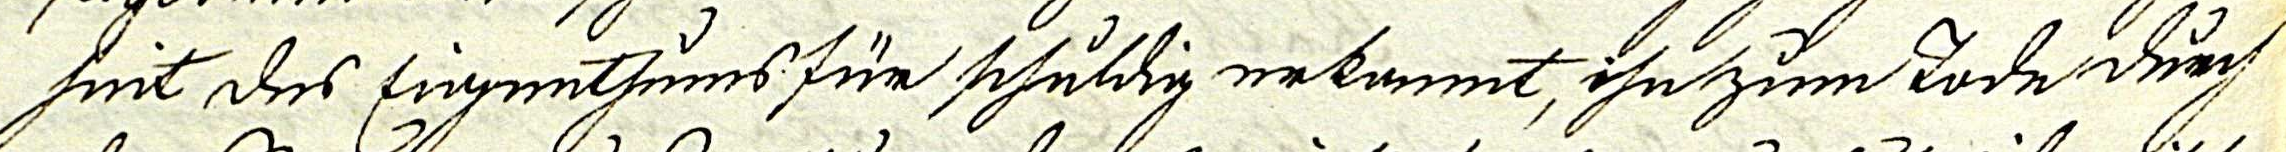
heit des Eigenthums für schuldig erkannt, ihn zum Tode durch
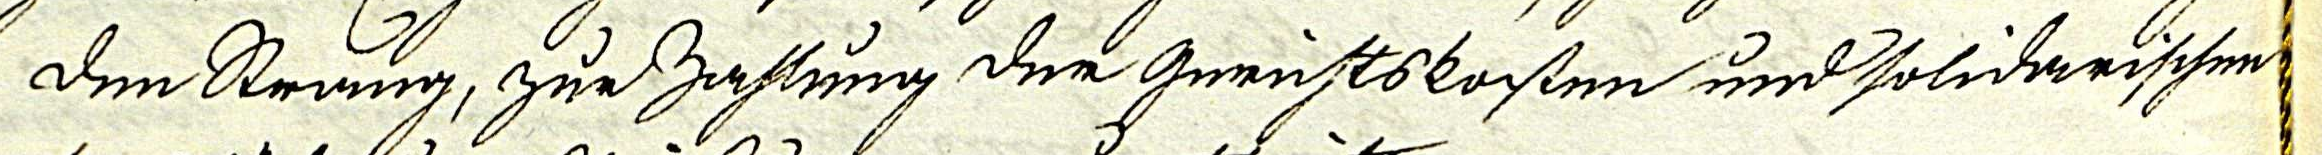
den Strang zur Zahlung der Gerichtskosten und solidarischen
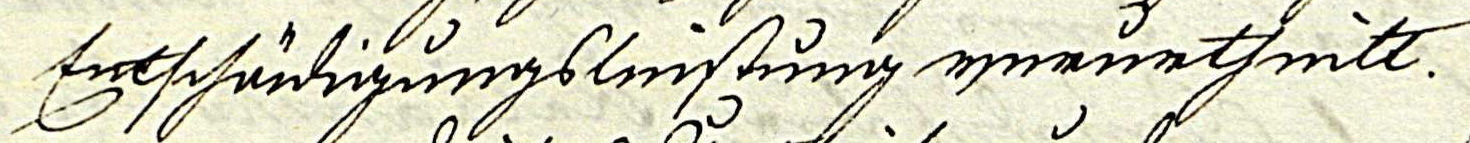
Entschädigungsleistung verurtheilt.
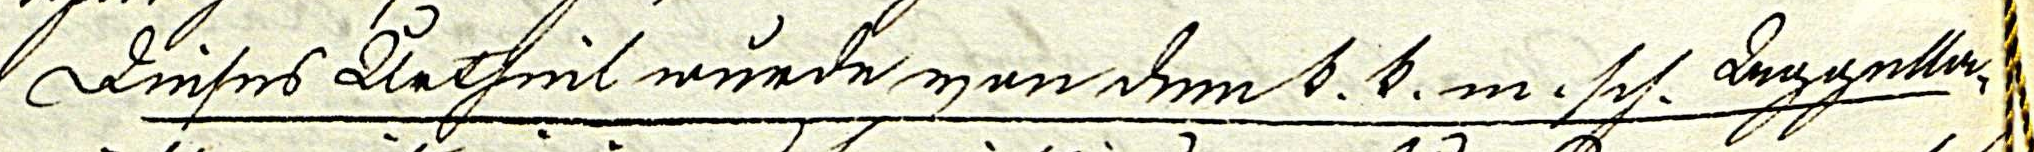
Dieses Urtheil wurde von dem k.k. m. sch. Appella¬
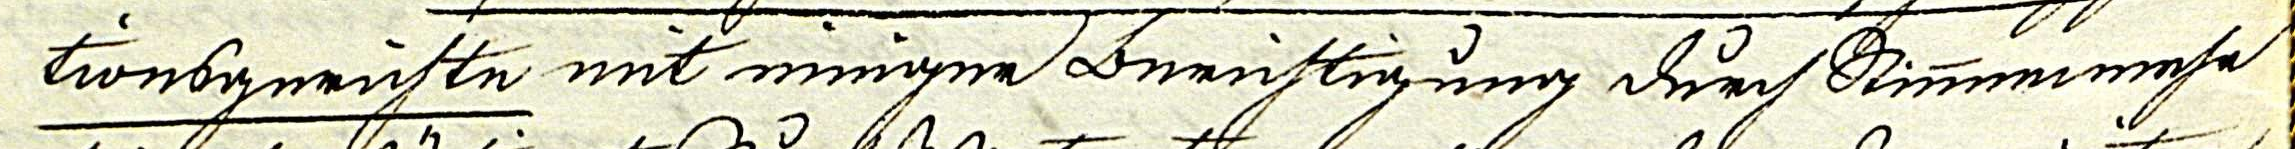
tionsgerichte mit einiger Berichtigung durch Stimmenmehr¬
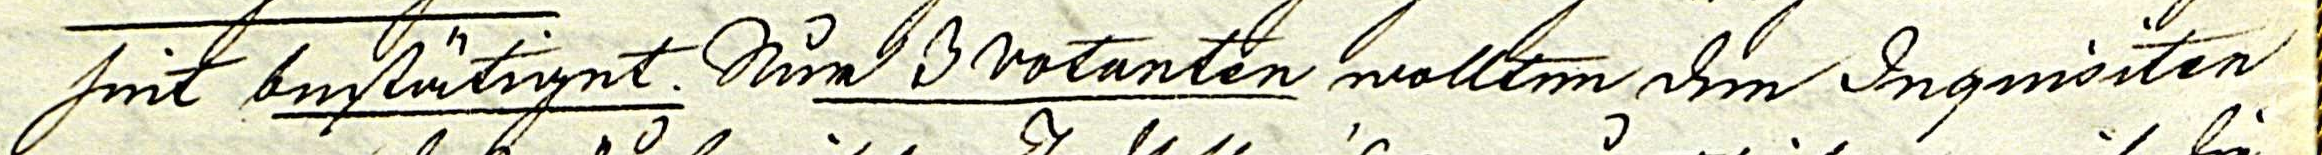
heit bestätigtet. Nur 3 Votanten wollten den Inquisiten
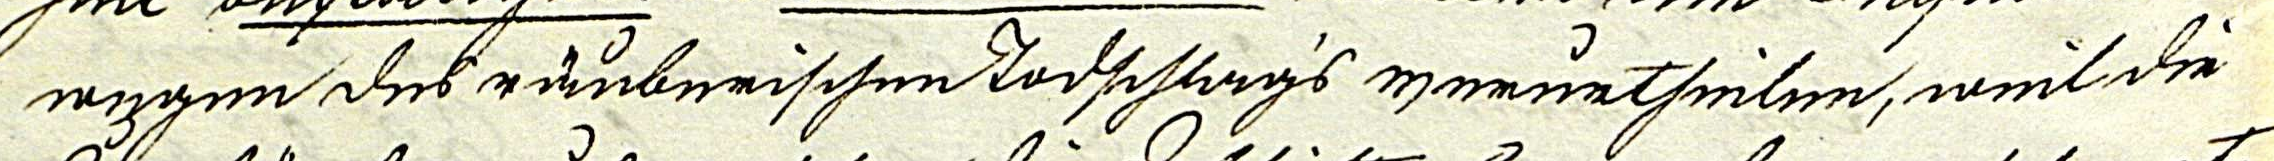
wegen des räuberischen Todschlag’s verurtheilen, weil die
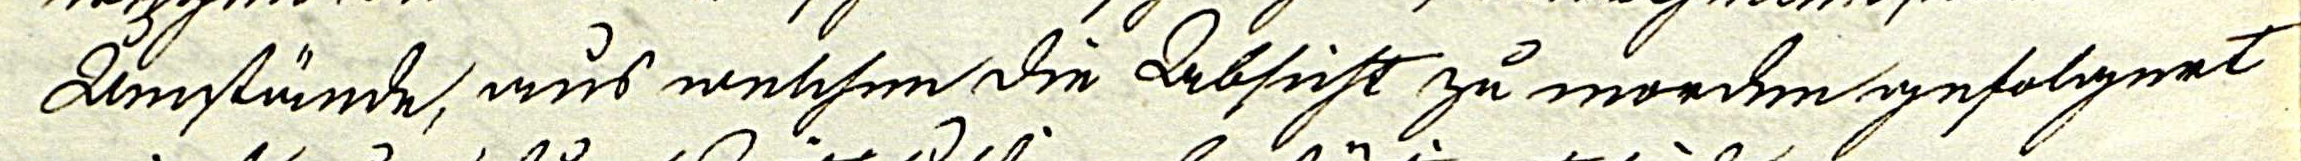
Umstände, aus welchem die Absicht zu morden gefolgert
